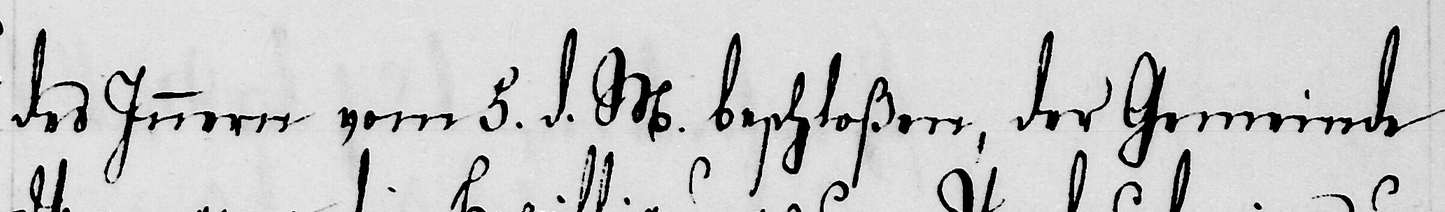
des Innern vom 5. d. M. beschloßen, der Gemeinde
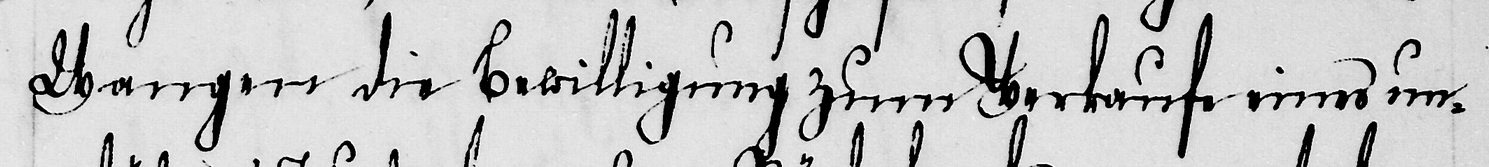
Wangen die Bewilligung zum Verkaufe eines un¬
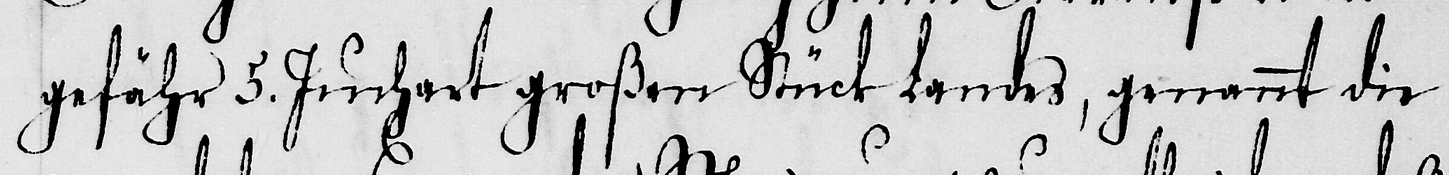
gefähr 5. Juchart großen Stück Landes, genannt die
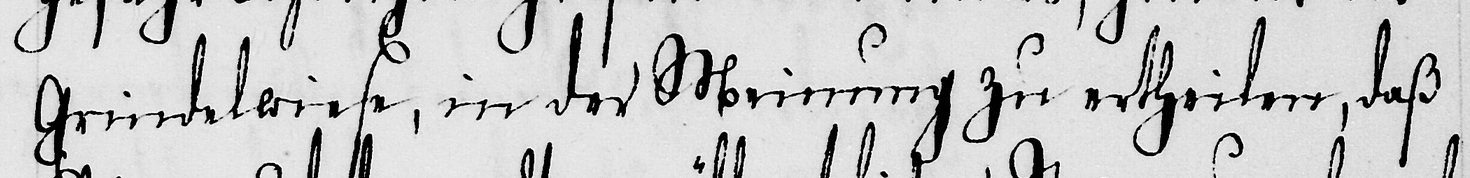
Grindelwiese, in der Meinung zu ertheilen, daß
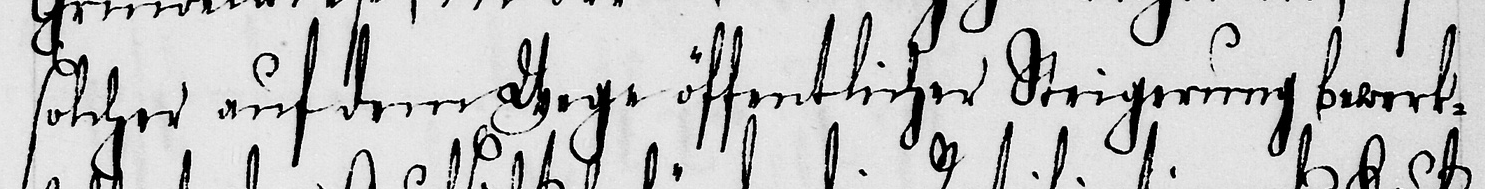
solcher auf dem Wege öffentlicher Steigerung bewerks¬
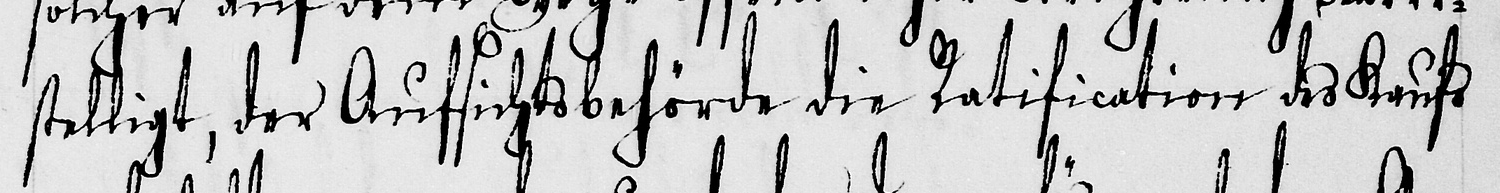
telligt, der Aufsichtsbehörde die Ratification des Kaufs
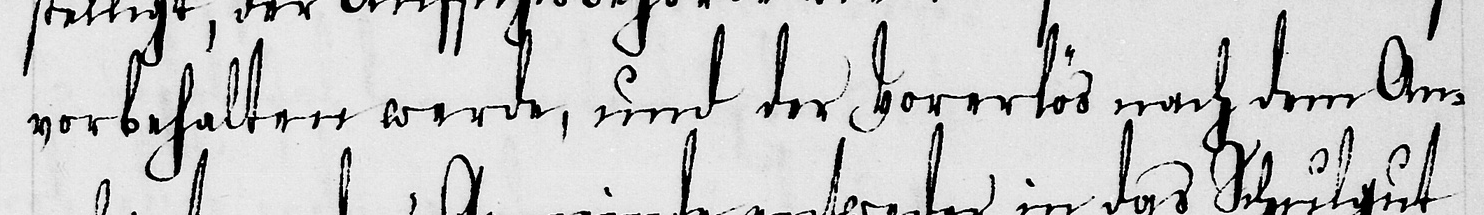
vorbehalten werde, und der Vorerlös nach dem An¬
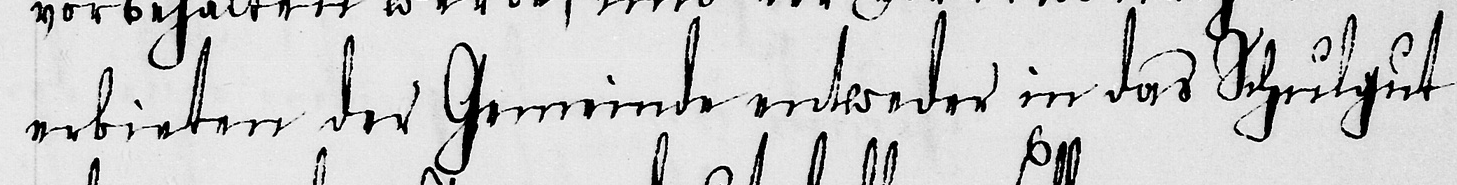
erbieten der Gemeinde entweder in das Schulgut
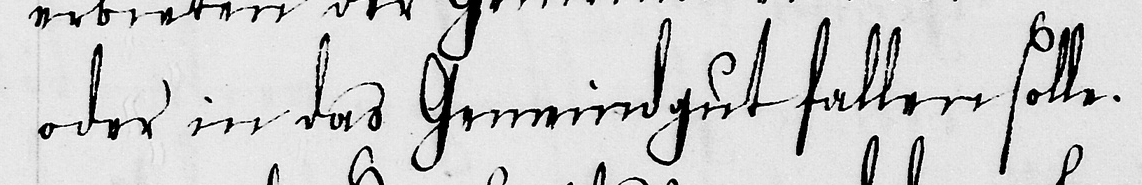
oder in das Gemeindgut fallen soll¬
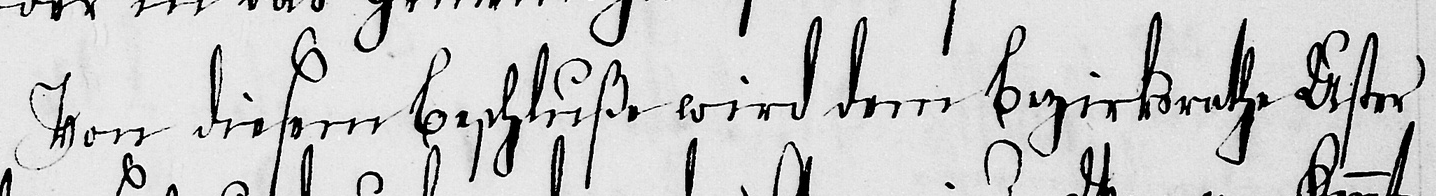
Von diesem Beschluße wird dem Bezirksrathe Uster
